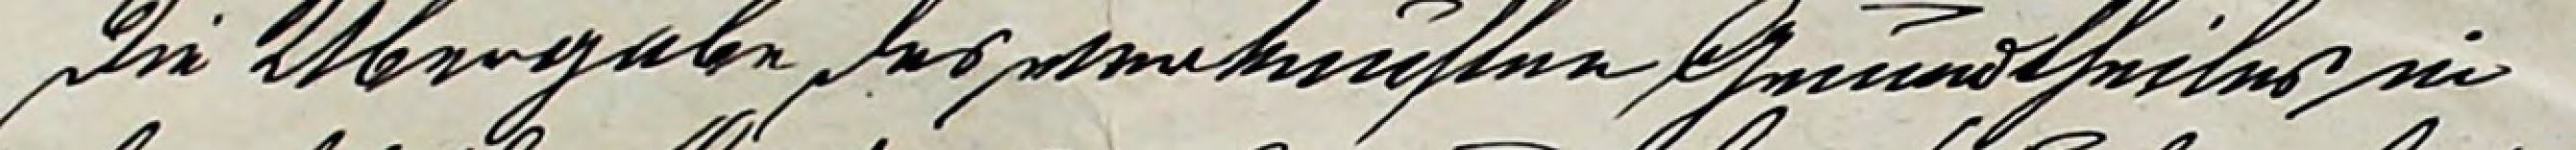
Die Übergabe des verkauften Grundtheiles in
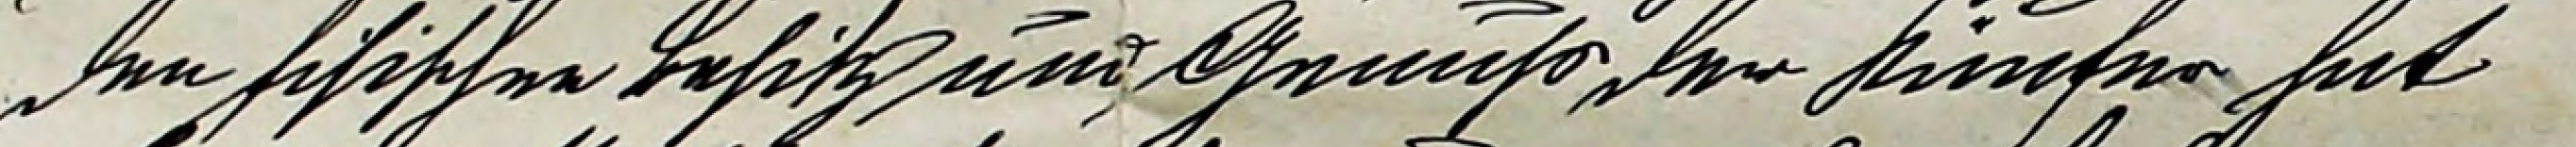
den Fisischen Besitz und Genuss der Käufer hat
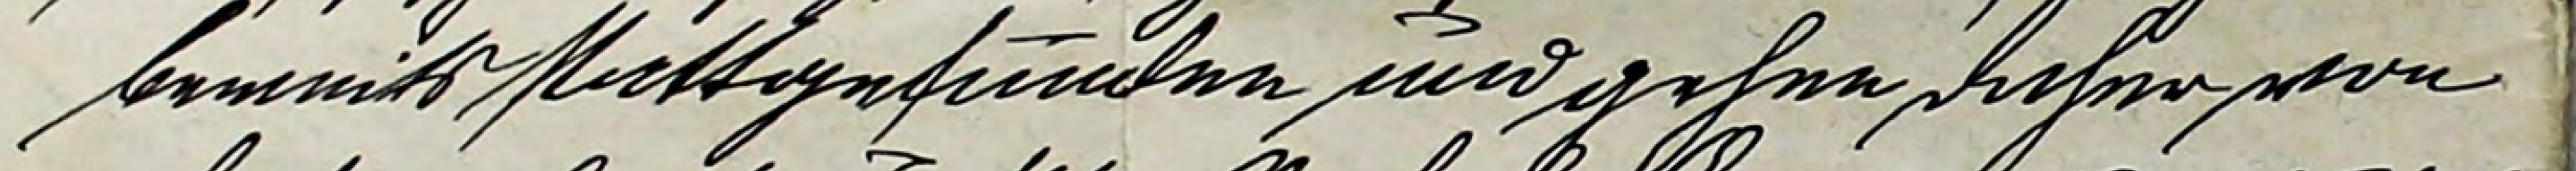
Cereitsstattgetunden und gehen daher von
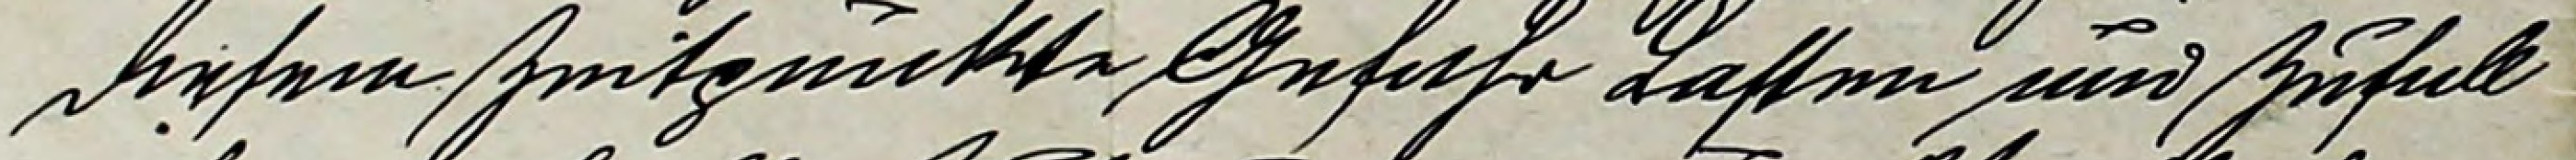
diesem Zeitpunkte Gefahr Lasten und Zufall
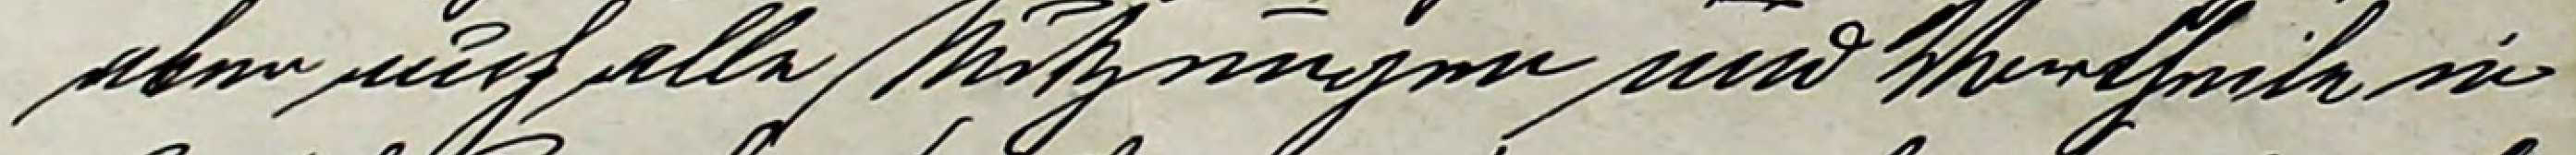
über auf alle Nutzungen und Vortheile in
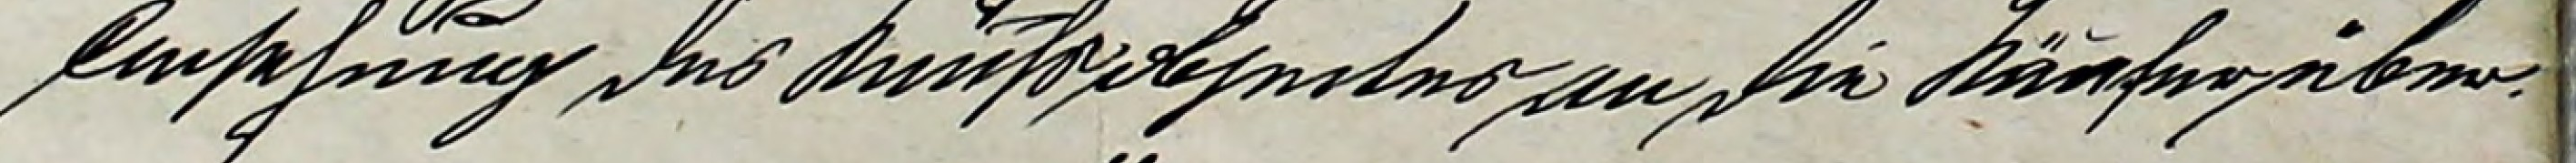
Ansehung des Käufe objertes an die Käufer über.
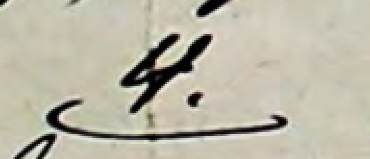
4.
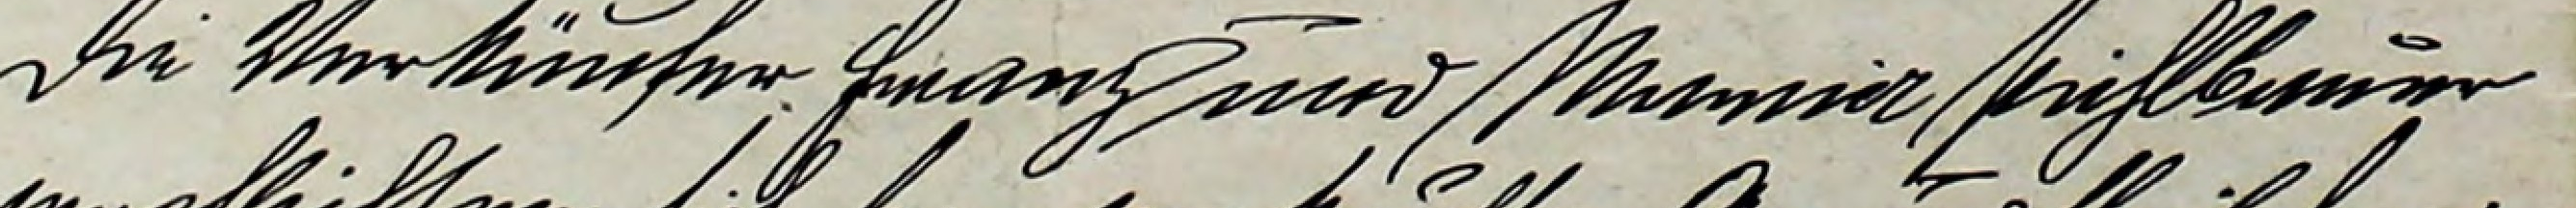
Die Verkäufer Franz und Maria Pichlbauer
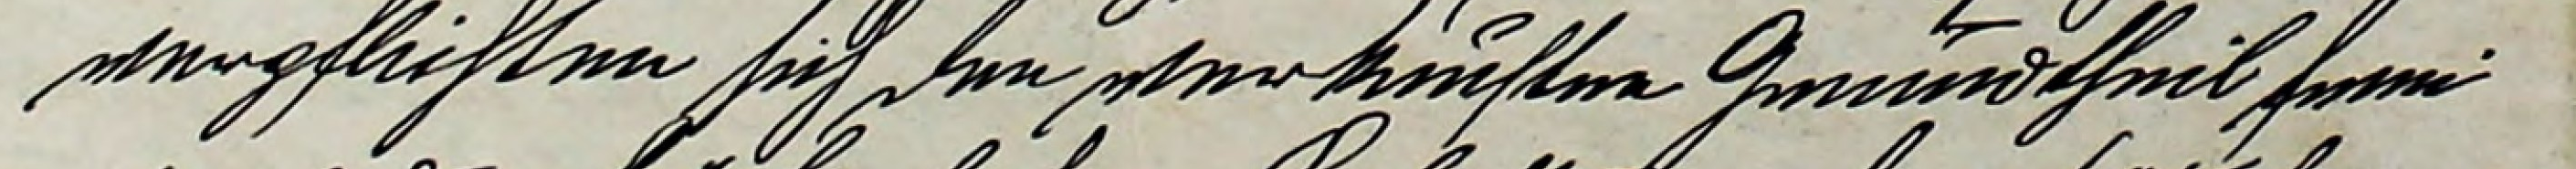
verpflichten sich den verkauften Grundtheil frei
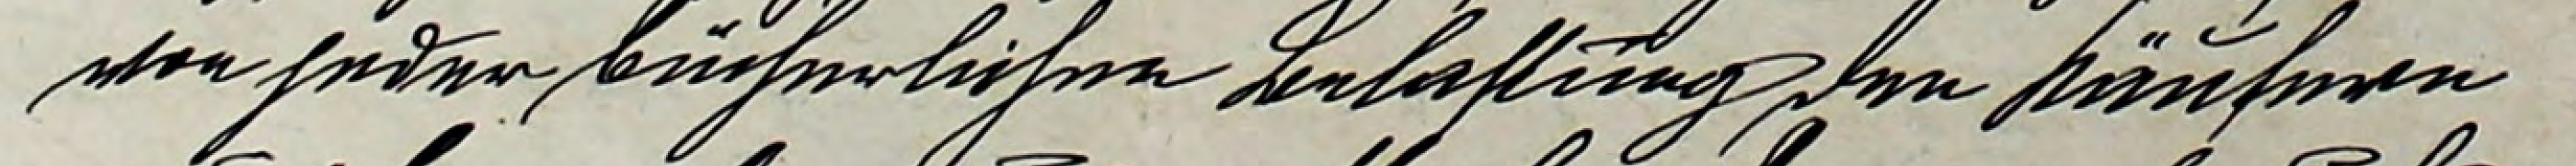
von feder bücherlichen Belastung den Käufern
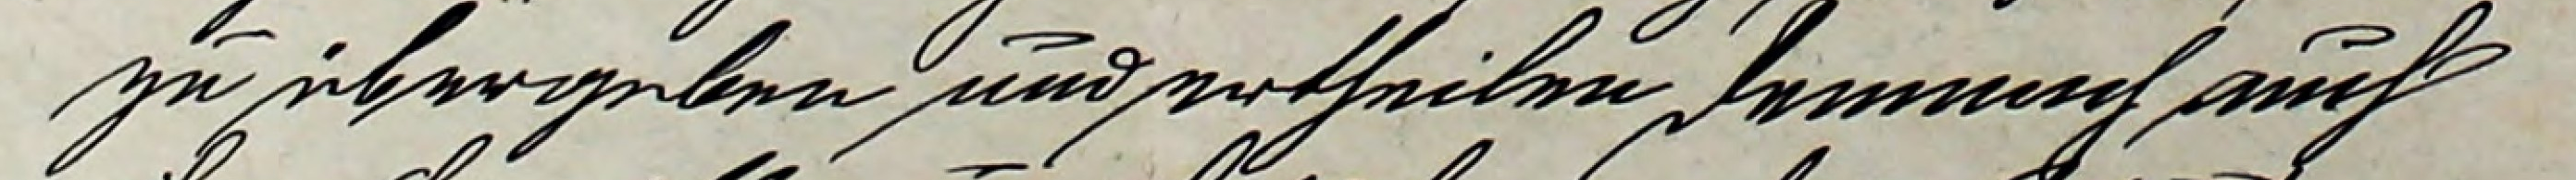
zu übergaben und ertheilen demnach auch
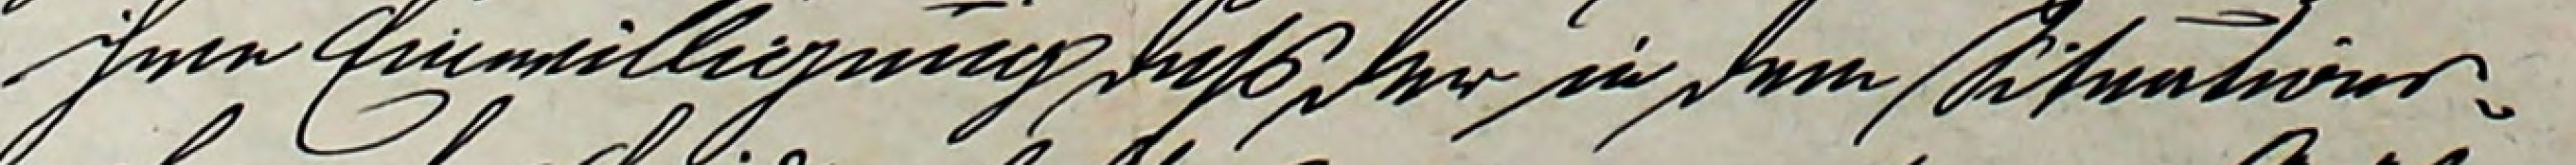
ihre Einwilligung dass der in dem Situations-
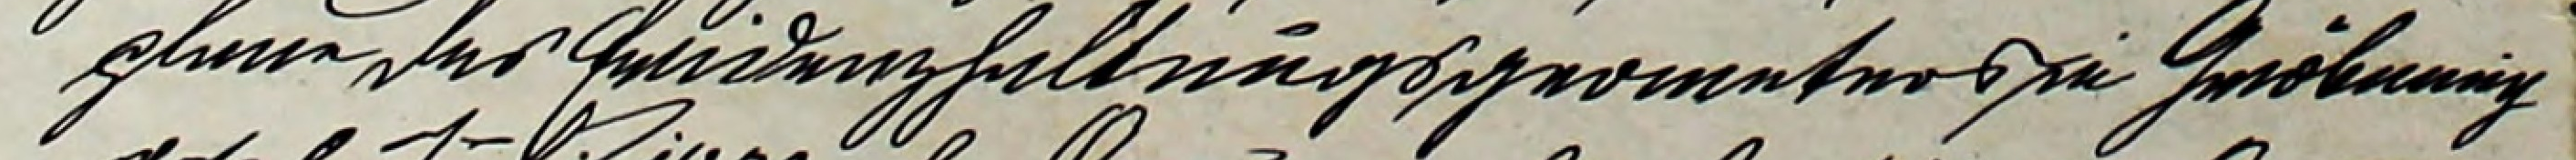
plane des Evidenzhaltungsgeometers in Gröbming
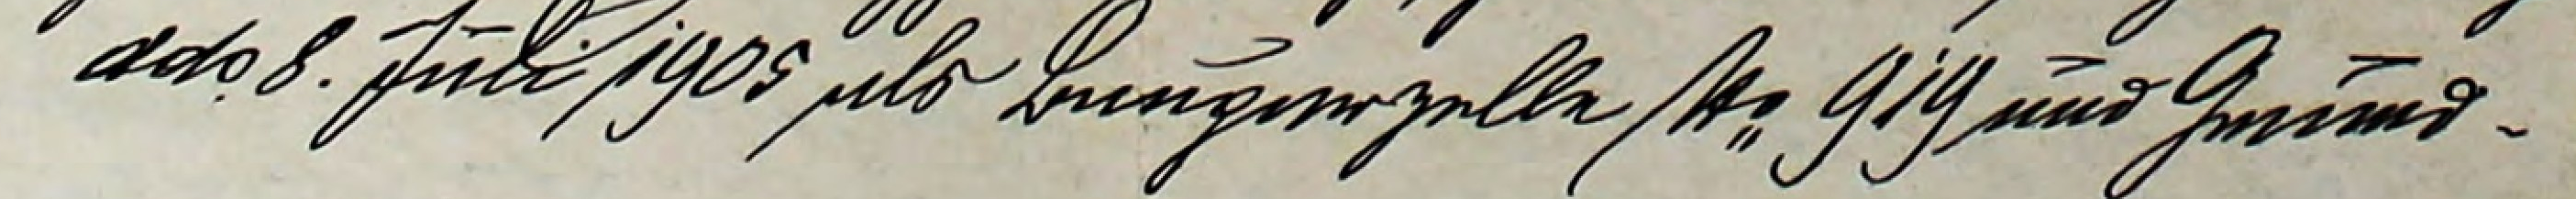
ddo 8. Juli 1905 als Bauparzelle No 919 und Grund-
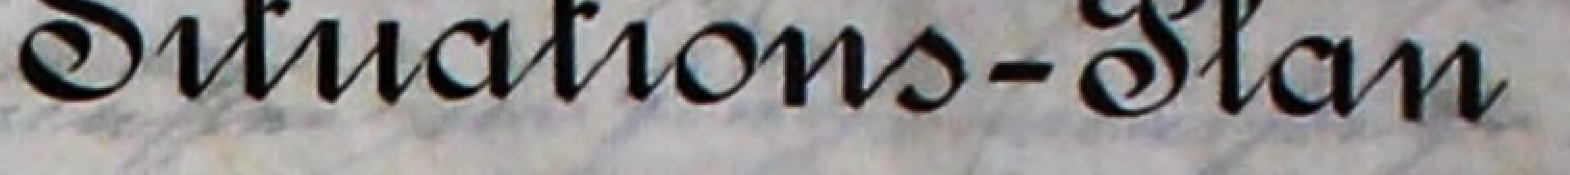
Situations-Plan
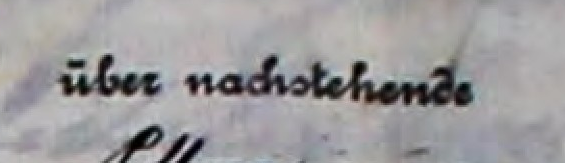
über nachstehende
